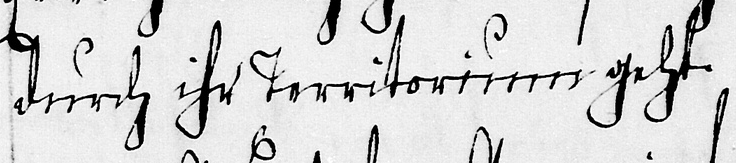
durch ihr Territorium geht.
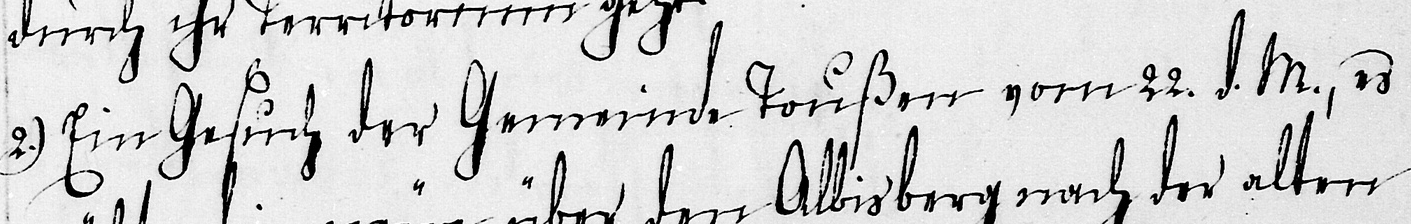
2.) Ein Gesuch der Gemeinde Toußen vom 22. d. M., es
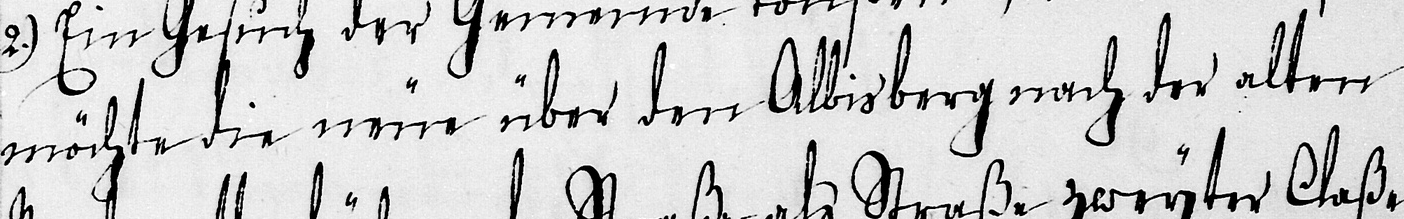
möchte die neue über den Albisberg nach der alten
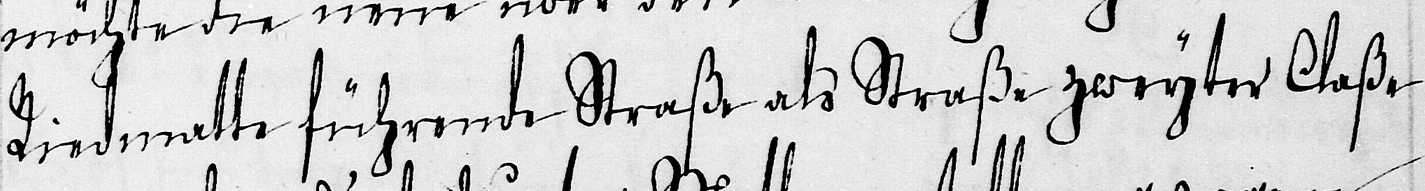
Riedmatte führende Straße als Straße zweyter Claße
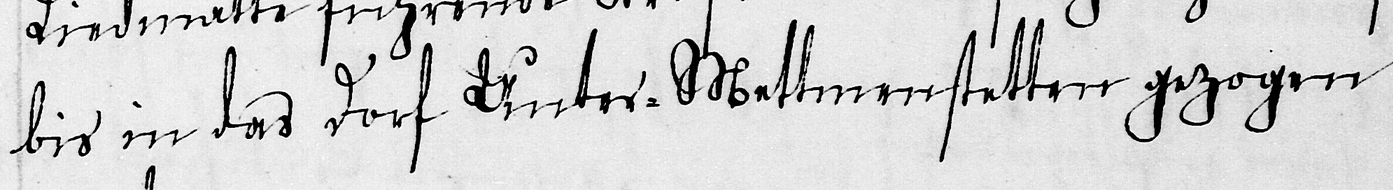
bis in das Dorf Unter-Mettmenstetten gezogen
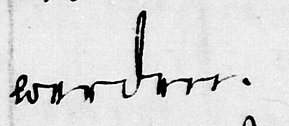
werden.
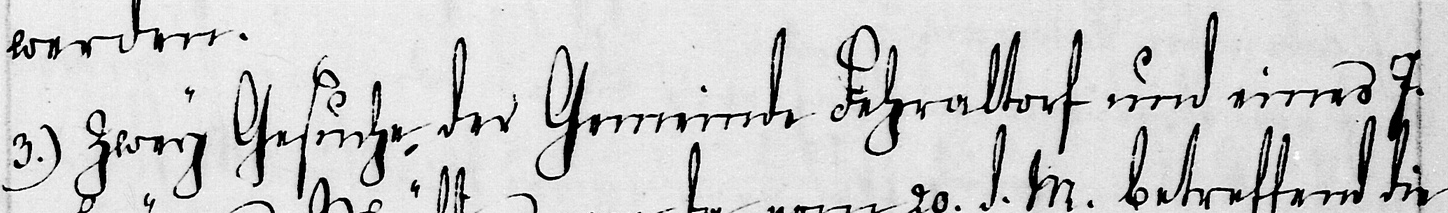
3.) Zwey Gesuche der Gemeinde Fehraltorf und eines J.
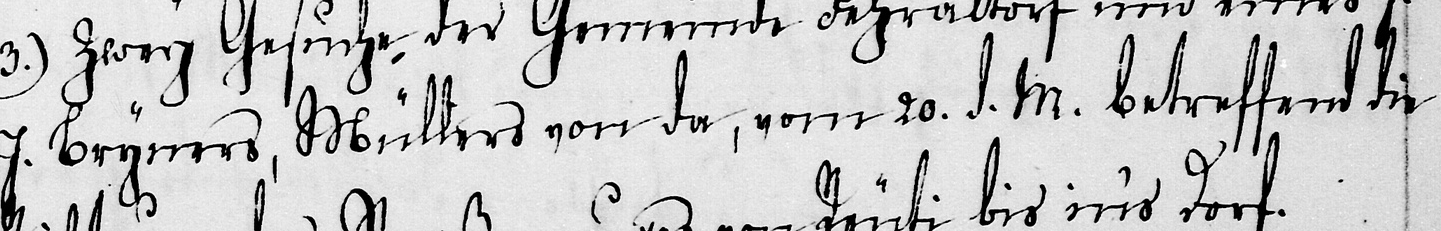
J. Bryners, Müllers von da, vom 20. d. M. betreffend die
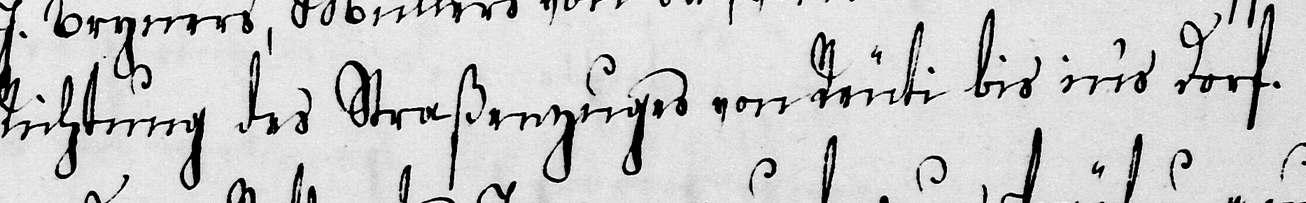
Richtung des Straßenzuges von Reuti bis in’s Dorf.
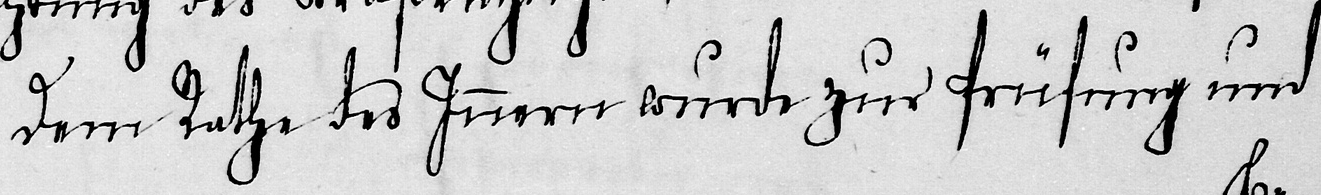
Dem Rathe des Innern wurde zur Prüfung und
